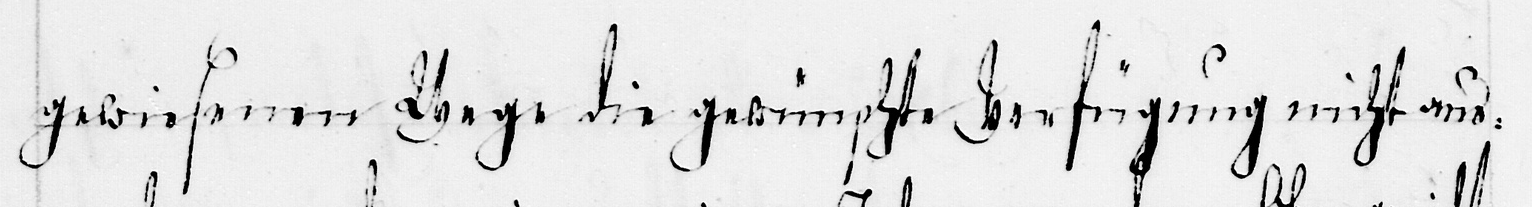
gewiesenen Wege die gewünschte Verfügung nicht aus¬
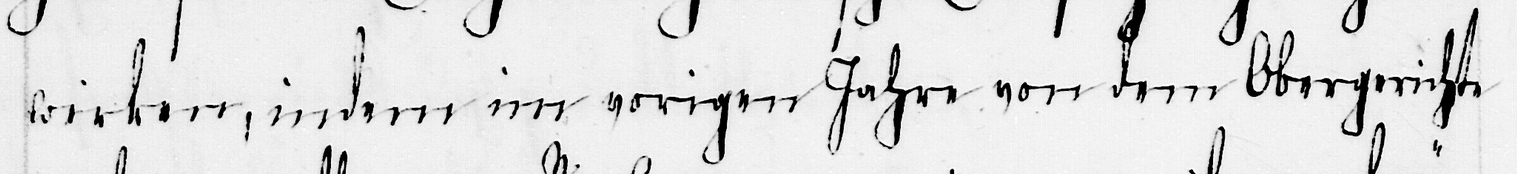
wirken, indem im vorigen Jahre von dem Obergerichte
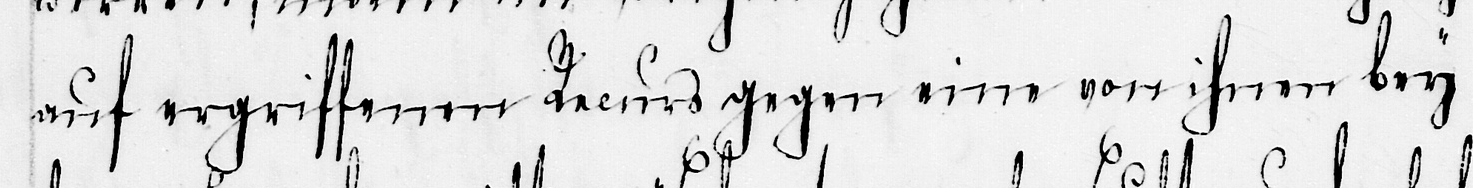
auf ergriffenen Recurs gegen eine von ihnen bey
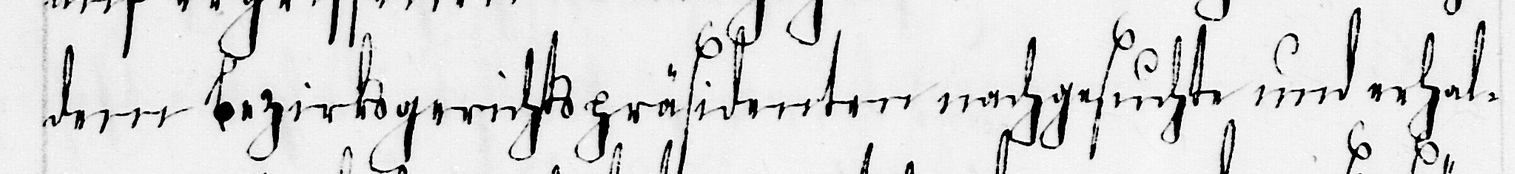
dem Bezirksgerichtspräsidenten nachgesuchte und erhal¬
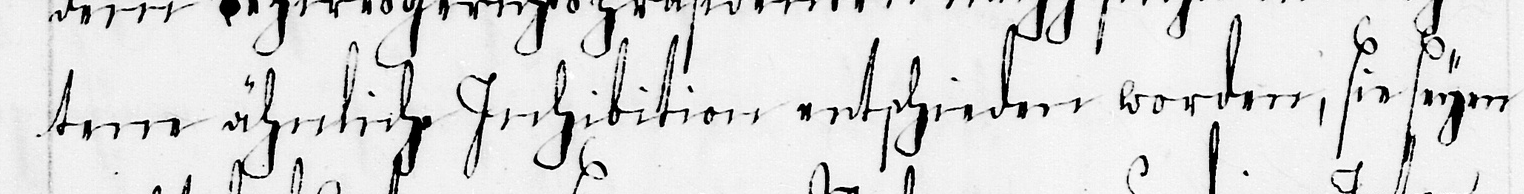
tene ähnliche Inhibition entschieden worden, sie seyen
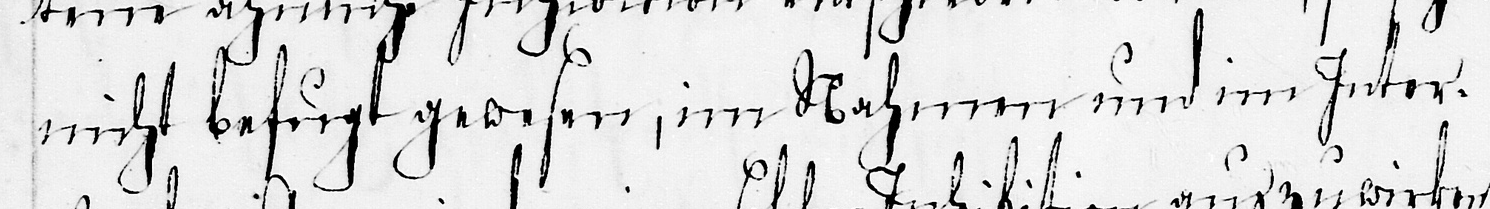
nicht befugt gewesen, im Nahmen und im Inter¬
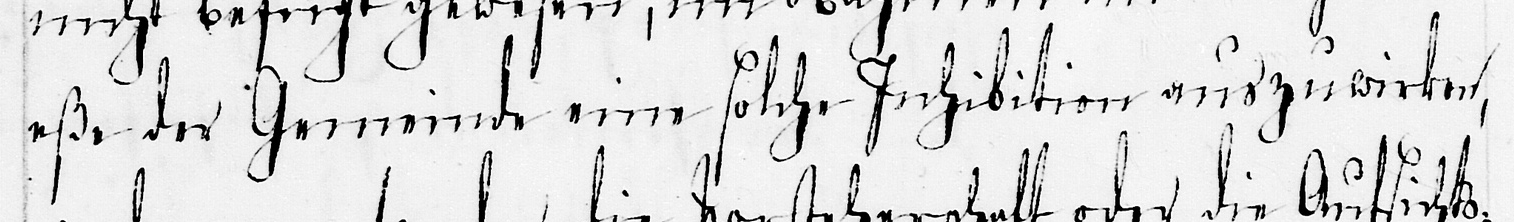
eße der Gemeinde eine solche Inhibition auszuwirken,
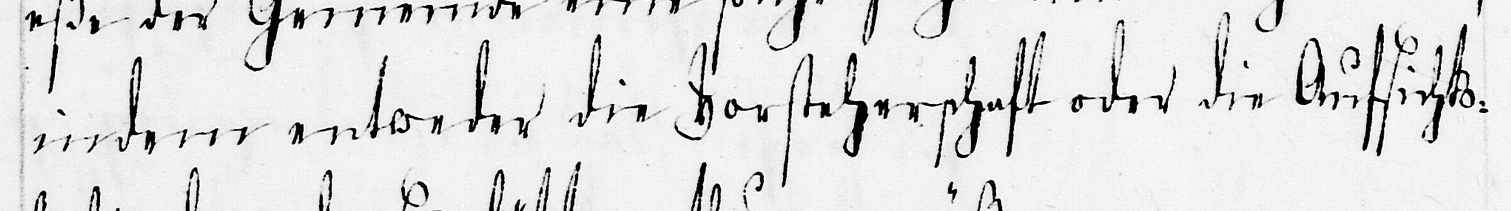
indem entweder die Vorsteherschaft oder die Aufsicht¬
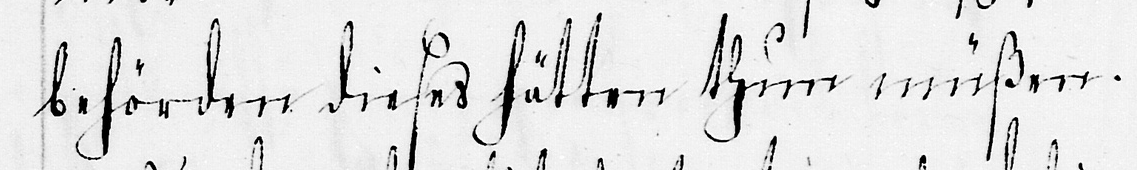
sbehörden dieses hätten thun müßen.
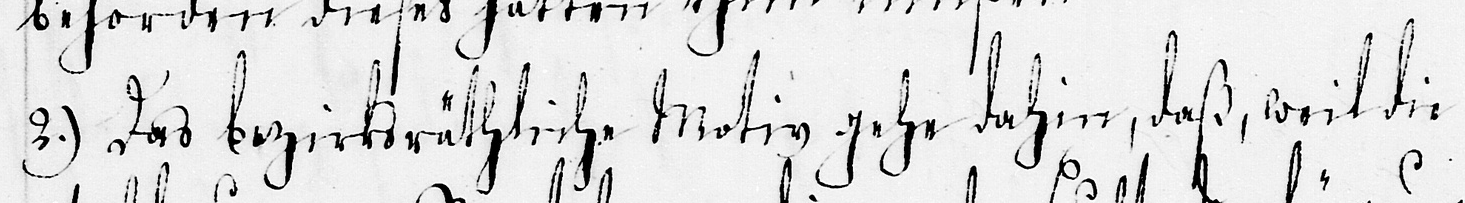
2.) Das bezirksräthliche Motiv gehe dahin, daß, weil die
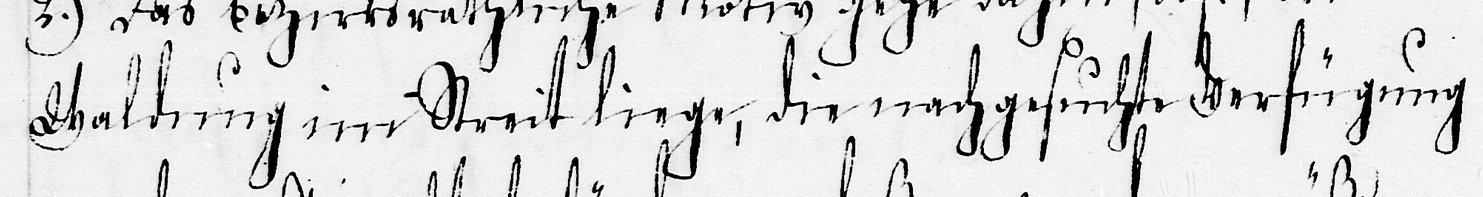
Waldung im Streit liege, die nachgesuchte Verfügung
